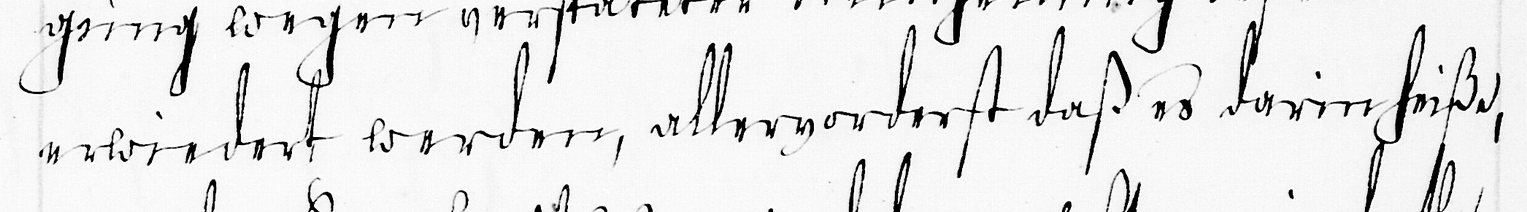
erwiedert werden, allervorderst daß es darin heiße,
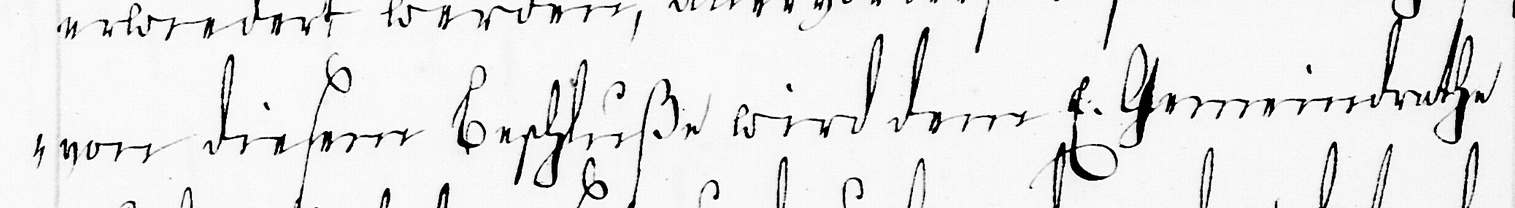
„von diesem Beschluße wird dem E. Gemeindrathe
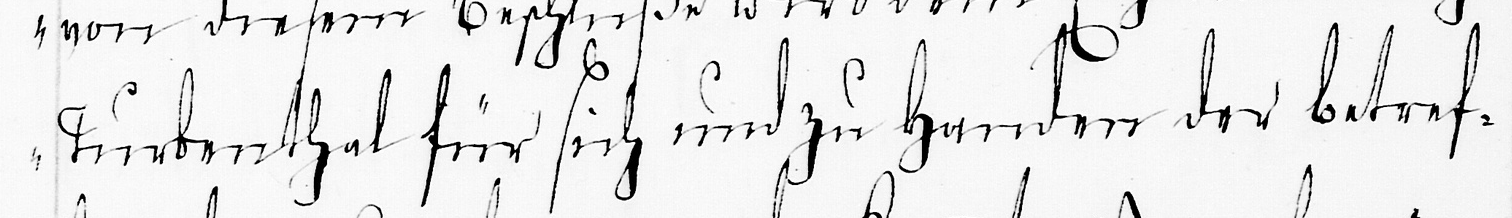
Turbenthal für sich und zu Handen der betref¬
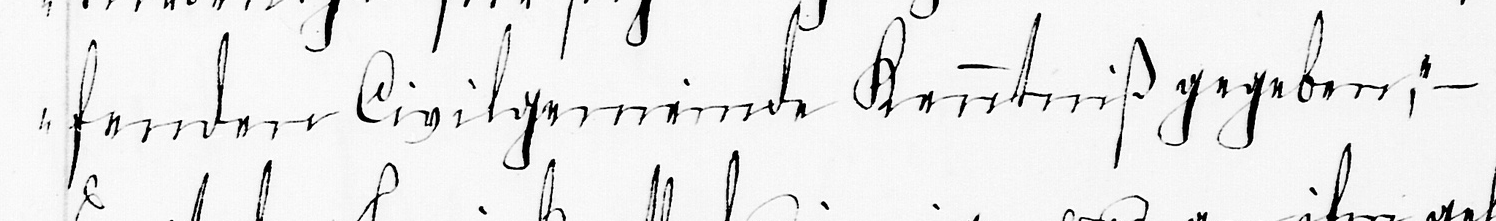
fenden Civilgemeinde Kenntniß gegeben,“ –
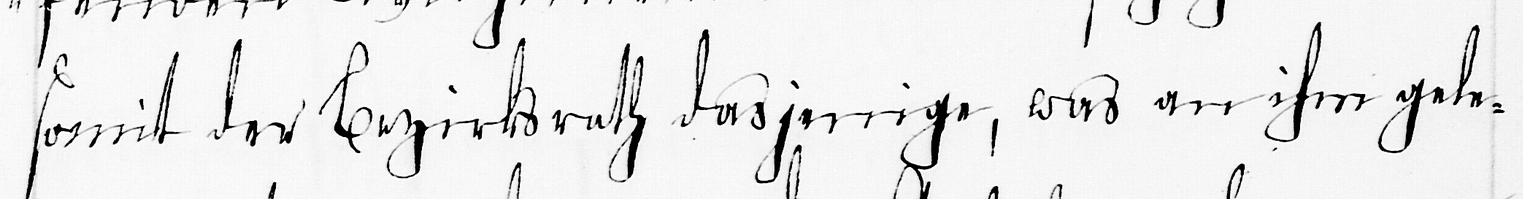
somit der Bezirksrath dasjenige, was an ihm gele¬
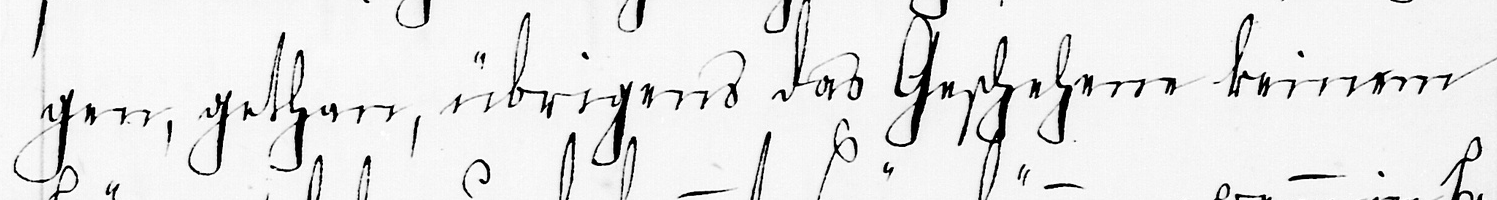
gen, gethan, übrigens das Geschehene keinem
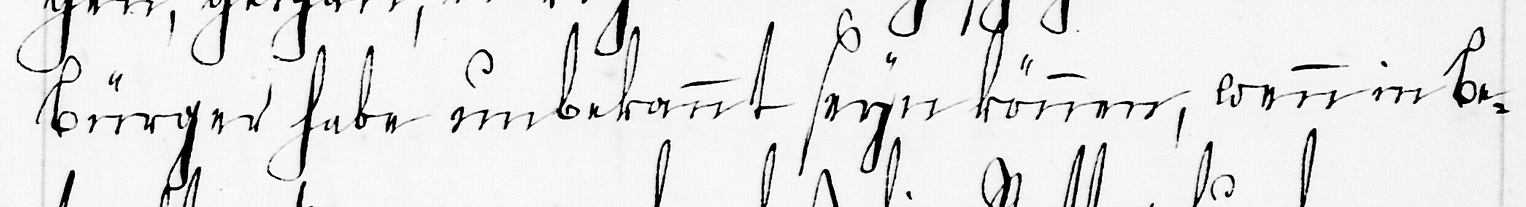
Bürger habe unbekannt seyn können, wenn in Be¬
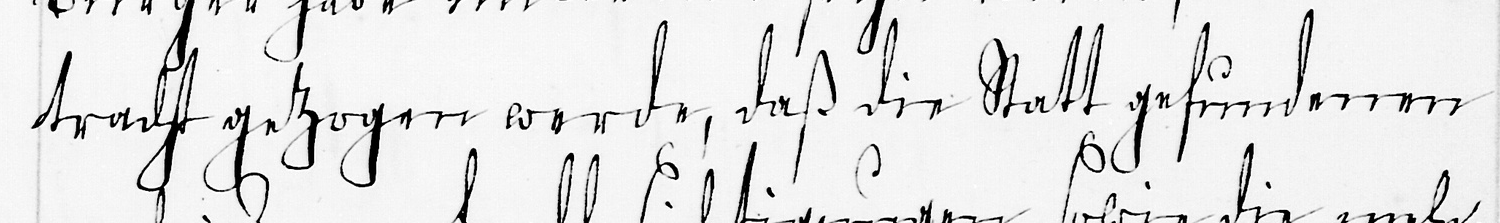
tracht gezogen werde, daß die Statt gefundenen
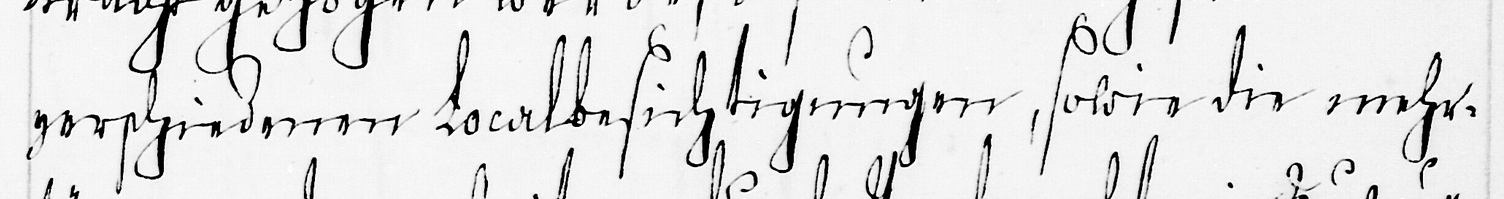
verschiedenen Localbesichtigungen, sowie die mehr¬
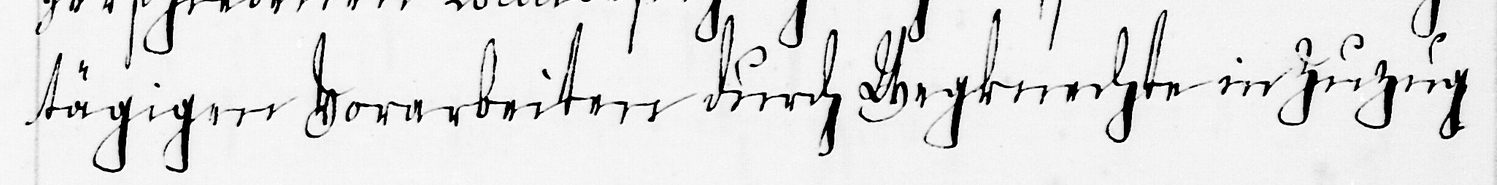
tägigen Vorarbeiten durch Wegknechte in Zuzug
